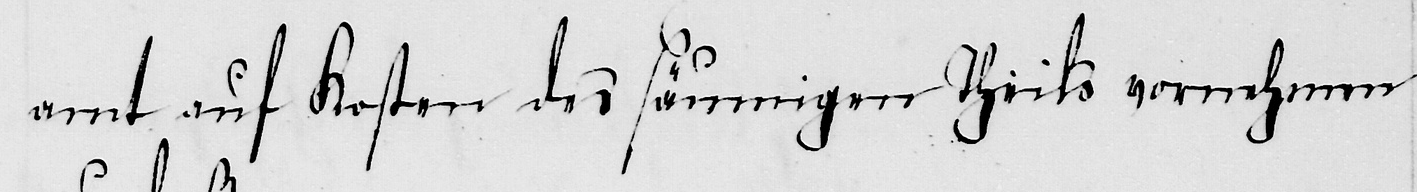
amt auf Kosten des säumigen Theils vornehmen
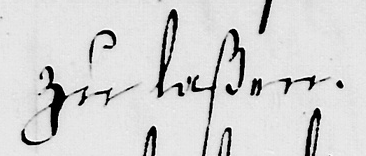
zu laßen.
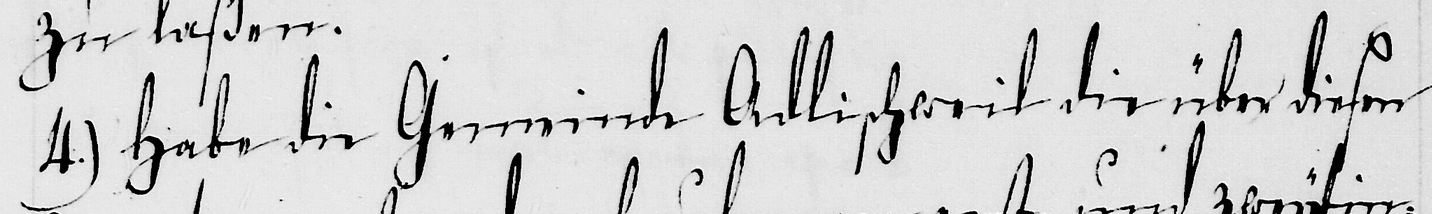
4.) Habe die Gemeinde Adlischweil die über diesen
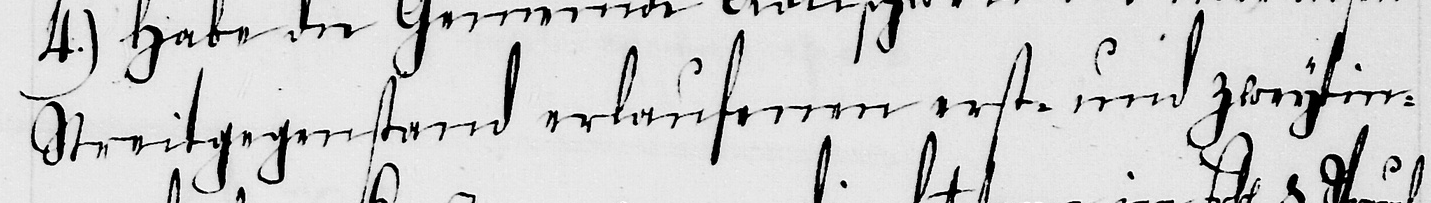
Streitgegenstand erlaufenen erst- und zweytin¬
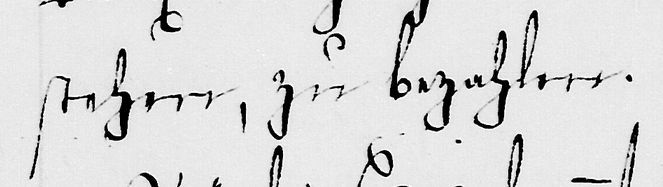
stehen, zu bezahlen.
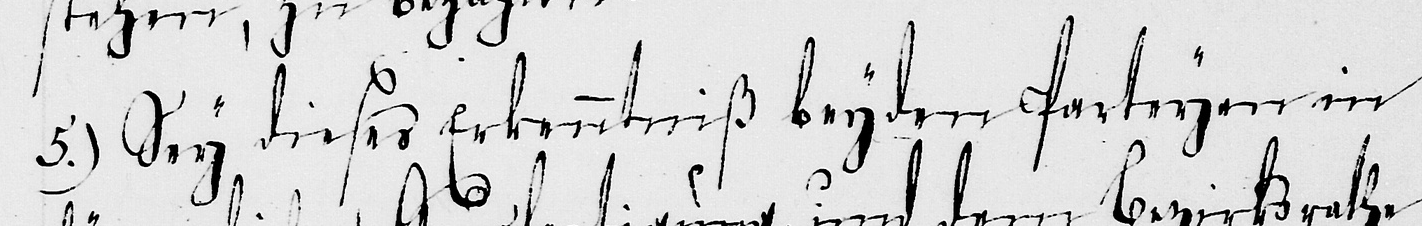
5.) Sey dieses Erkenntniß beyden Parteyen in
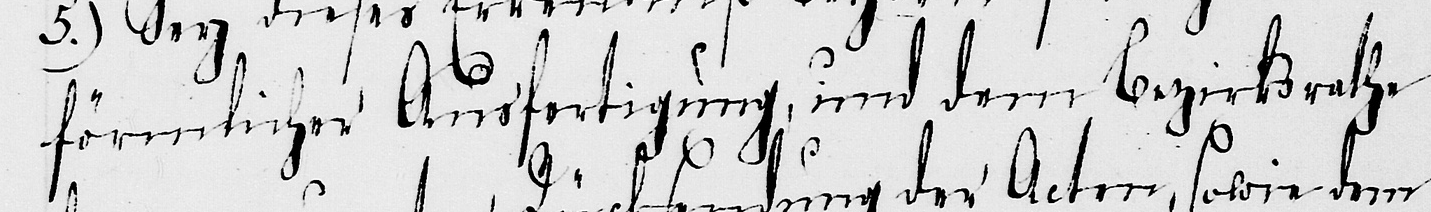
förmlicher Ausfertigung, und dem Bezirksrathe
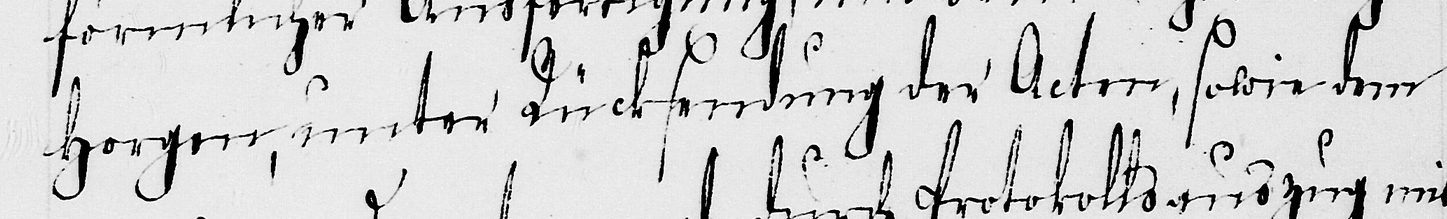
Horgen, unter Rücksendung der Acten, sowie dem
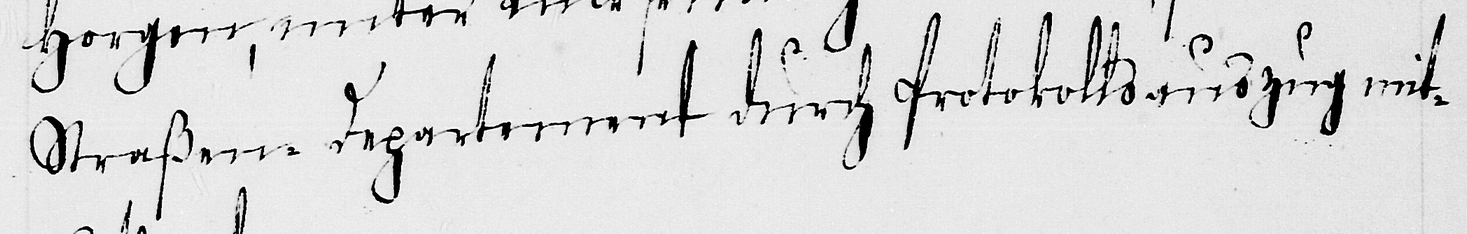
Straßen-Departement durch Protokollsauszug mit¬
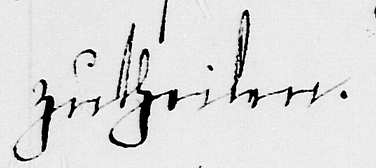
zutheilen.
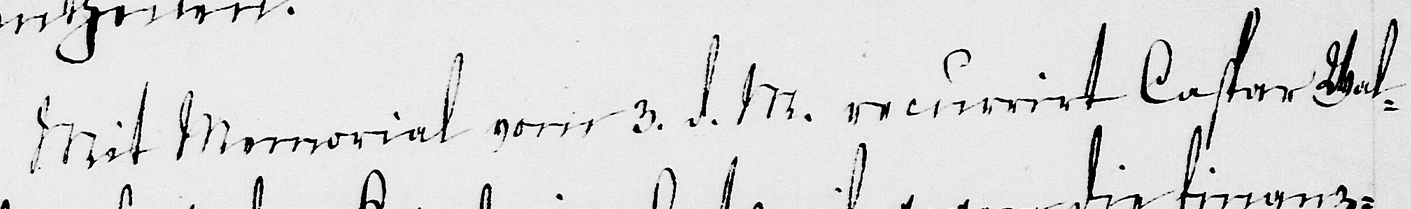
Mit Memorial vom 3. d. M. recurrirt Caspar Wal¬
